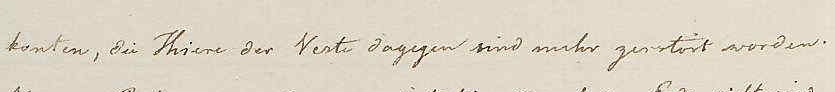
konten, die Thiere der Veste dagegen sind mehr zerstört worden.
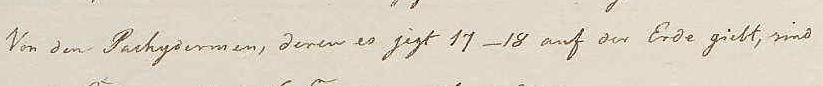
Von den Pachydermen, deren es jezt 17–18 auf der Erde giebt, sind
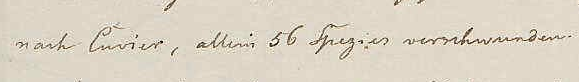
nach Cuvier, allein 56 Spezies verschwunden.
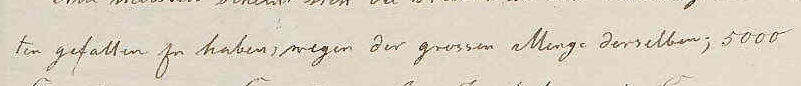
ten gefallen zu haben, wegen der grossen Menge derselben; 5000
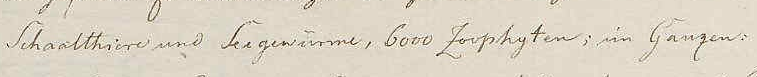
Schaalthiere und Seegewürme, 6000 Zoophyten; im Ganzen:
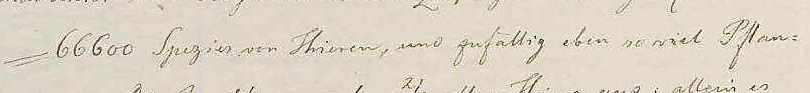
66600 Spezies von Thieren, und zufällig eben so viel Pflan-
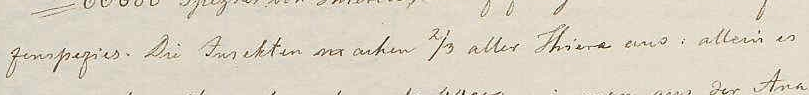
zenspezies. Die Insekten nmachen ⅔ aller Thiere aus: allein es
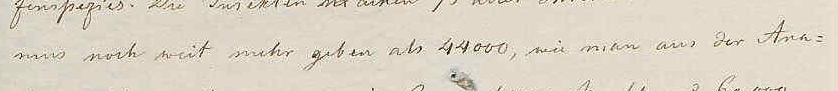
mus noch weit mehr geben als 44000, wie man aus der Ana-
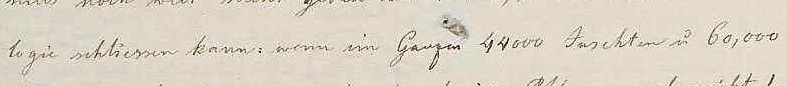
logie schliessen kann: wenn im Ganzen 44000 Insekten u 60,000
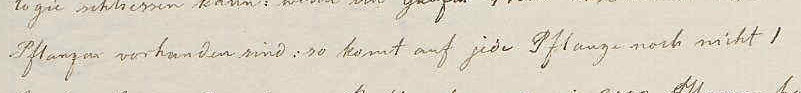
Pflanzen vorhanden sind: so komt auf jede Pflanze noch nicht 1
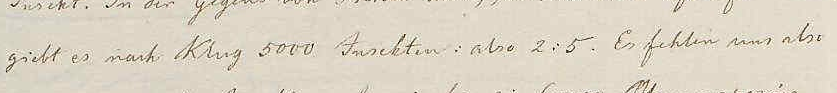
giebt es nach Klug 5000 Insekten: also 2:5. Es fehlen uns also
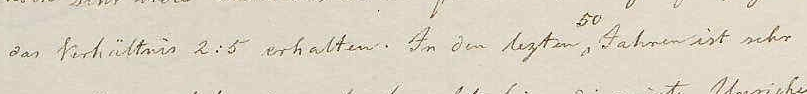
das Verhältnis 2:5 erhalten. In den lezten 50 Jahren ist sehr
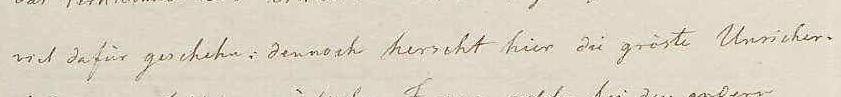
viel dafür geschehn: dennoch herscht hier die gröste Unsicher-
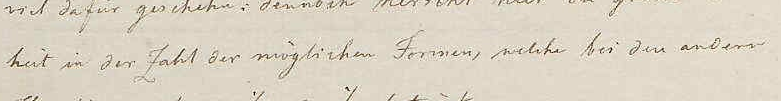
heit in der Zahl der möglichen Formen, welche bei den andern
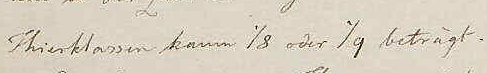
Thierklassen kaum ⅛ oder ⅑ beträgt.
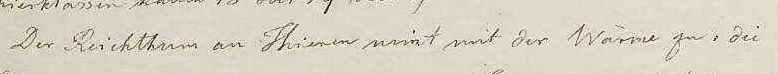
Der Reichthum an Thieren nimt mit der Wärme zu: die
